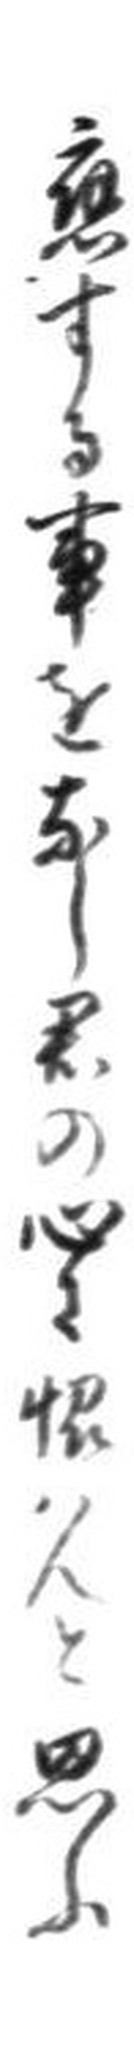応する事をなし君の心に協はんと思ふ
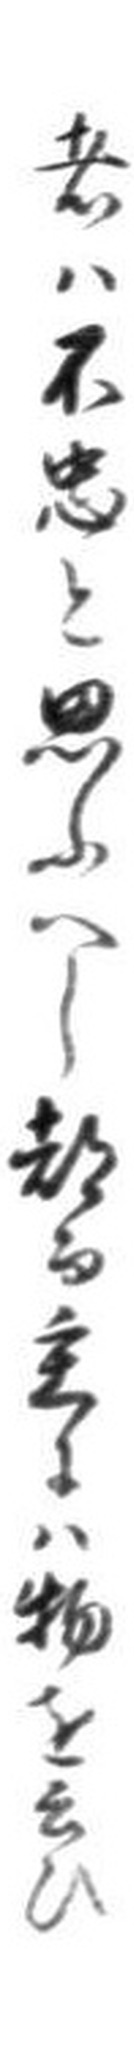者は不忠と思ふへし都而主には物を云ひ
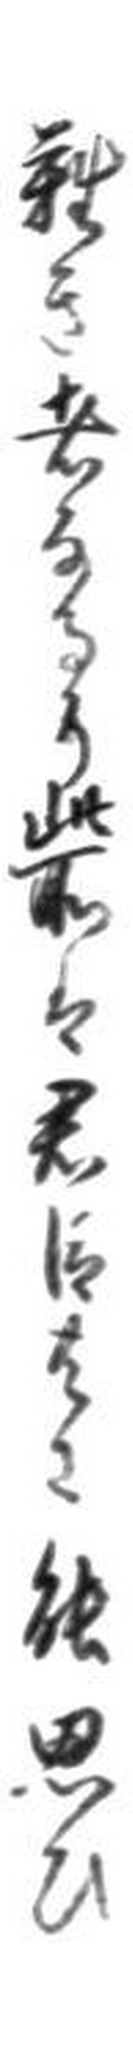難き者なるに此所は君臣共に能思ひ
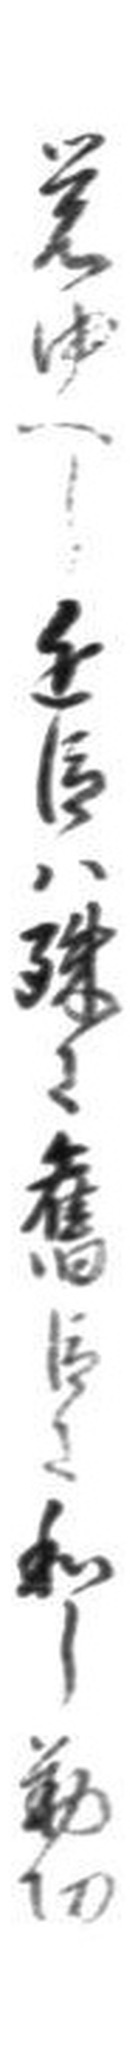覚ゆへし近臣は殊に旧臣に和し勤切
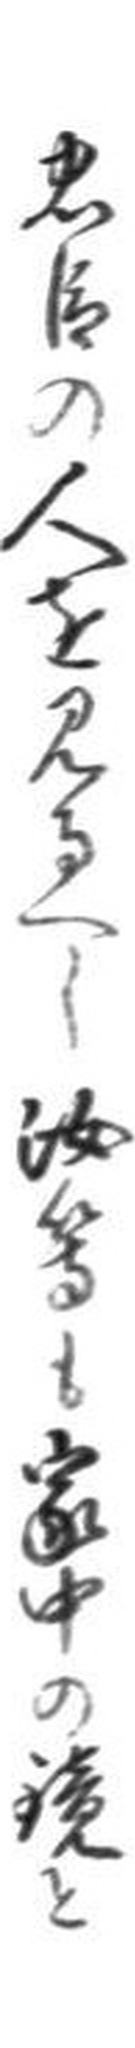忠臣の人をみるへし汝等も家中の鏡と

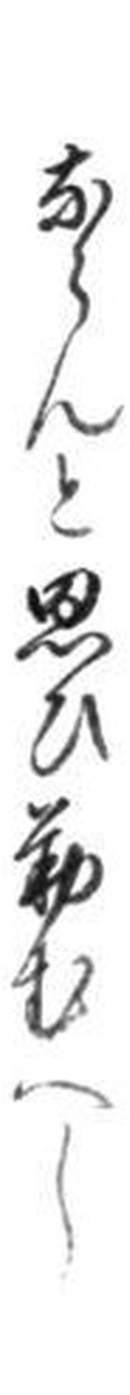ならんと思ひ勤むへし
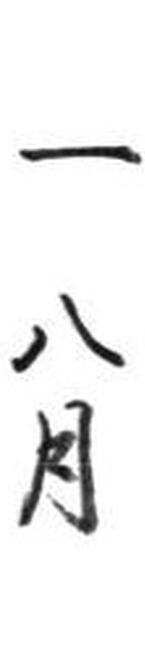一八月
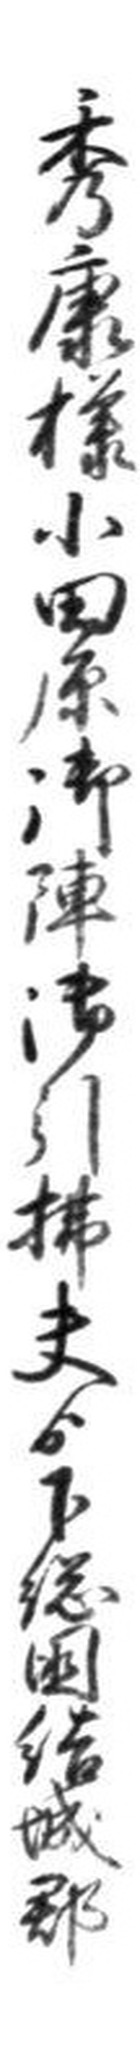秀康様小田原御陣御引払夫ゟ下総国結城郡
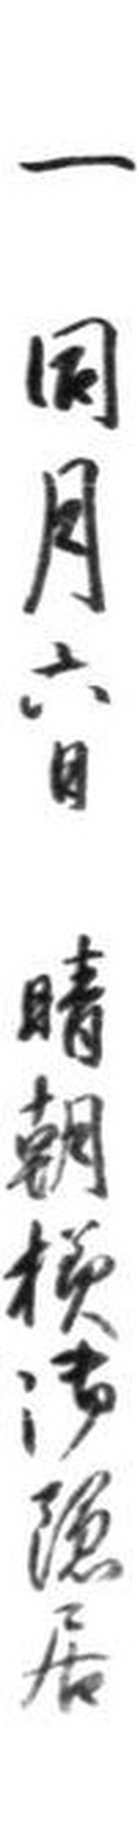一同月六日晴朝様御隠居
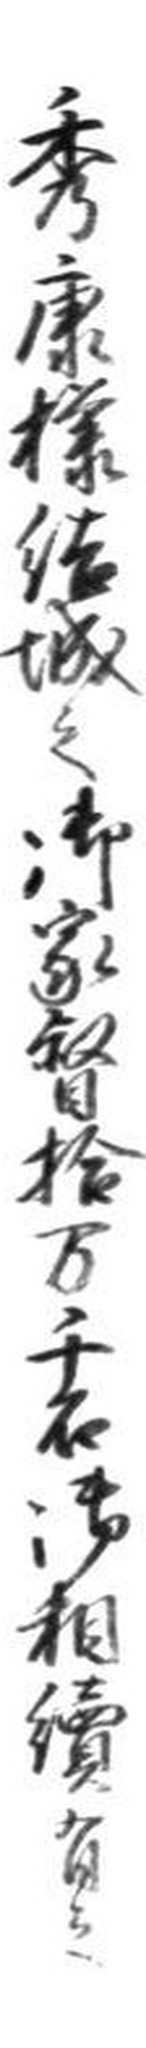秀康様結城之御家督拾万千石御相続有之
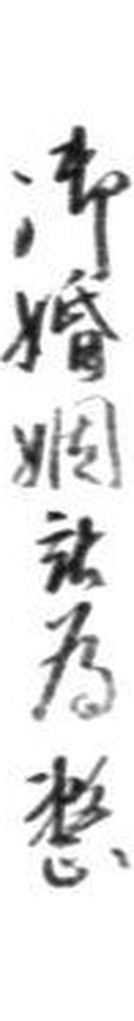御婚姻被為整
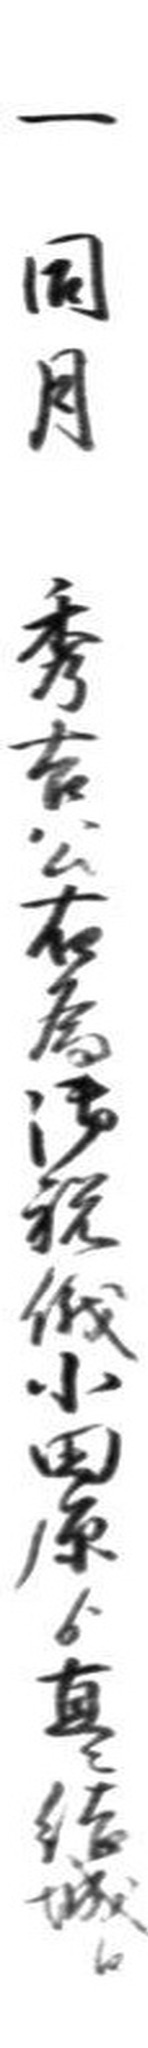一同月秀吉公右為御祝儀小田原ゟ直に結城江
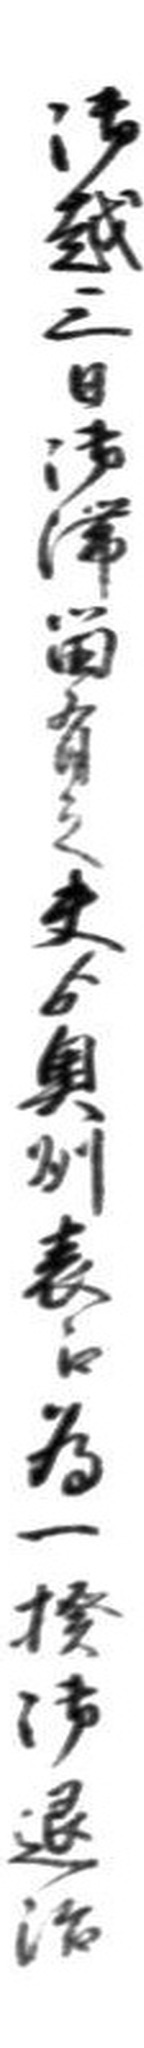御越三日御滞留有之夫ゟ奥州表江為一揆御退治
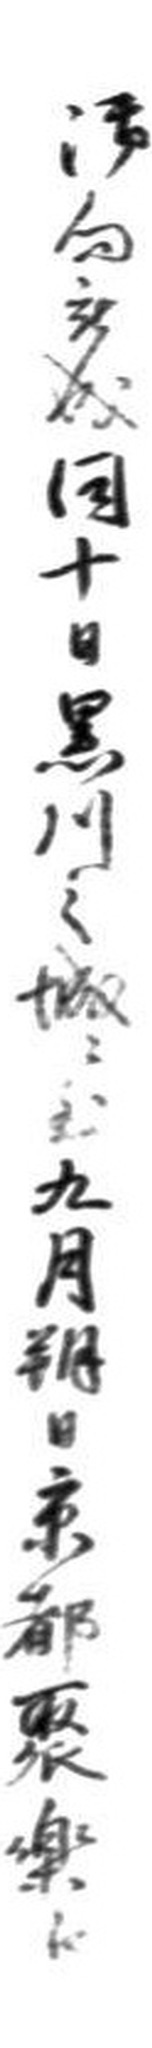御向被成同十日黒川之城に至九月朔日京都聚楽江
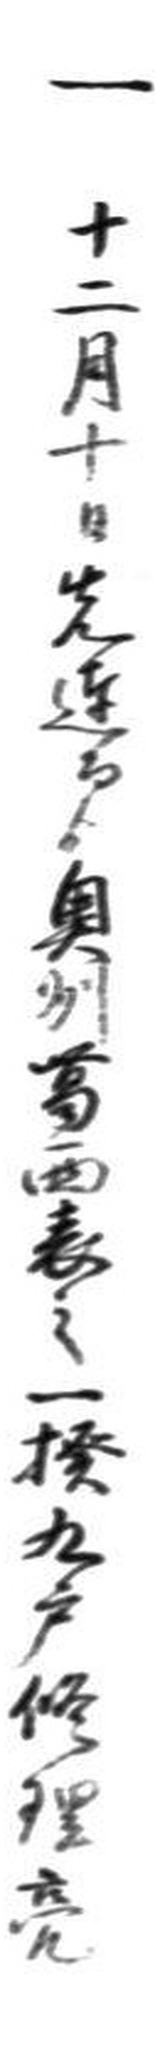一十二月十日先達てゟ奥州葛西表之一揆九戸修理亮
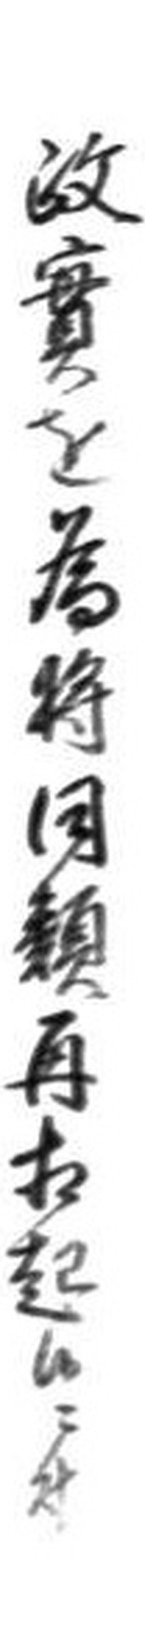政実を為将同類再相起候に付
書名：家譜 一 秀康公 従天正二年到慶長十二年
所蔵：福井県文書館 Fukui Prefectural Archives
